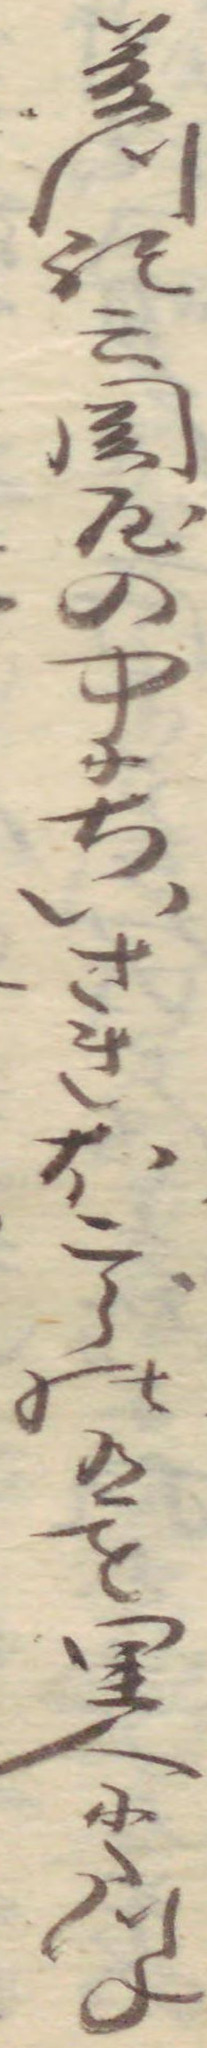藤川記云関屋の中にちいさきほこらの有を里人にたつね
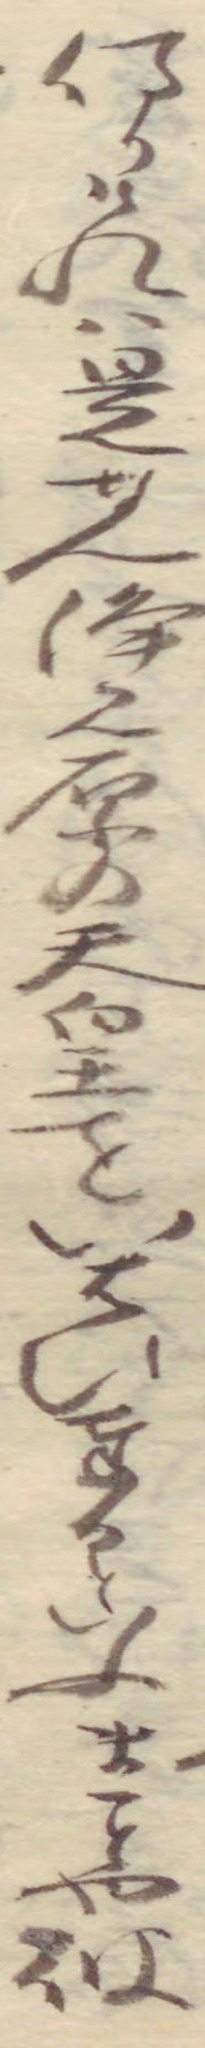侍りけれは是なん浄見原の天皇をいはひ奉るといふまことや彼
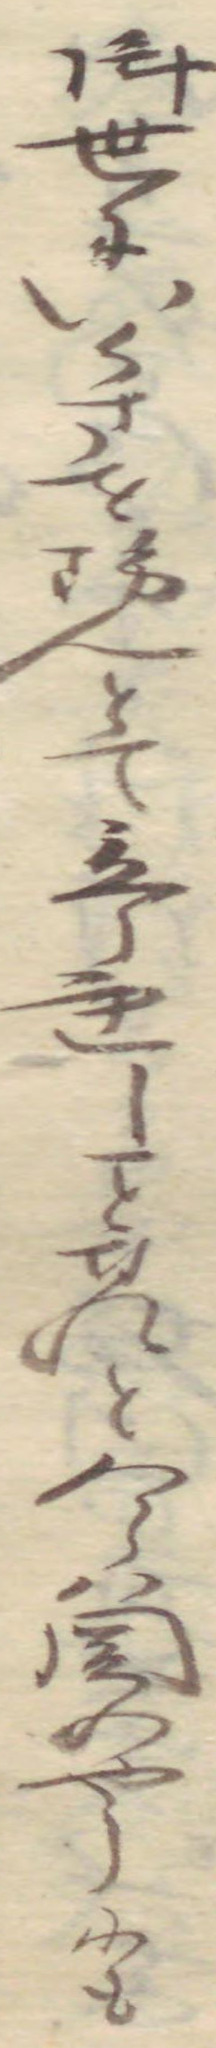御世にいくさを防んとて立られしことなれと今は関のやうにも
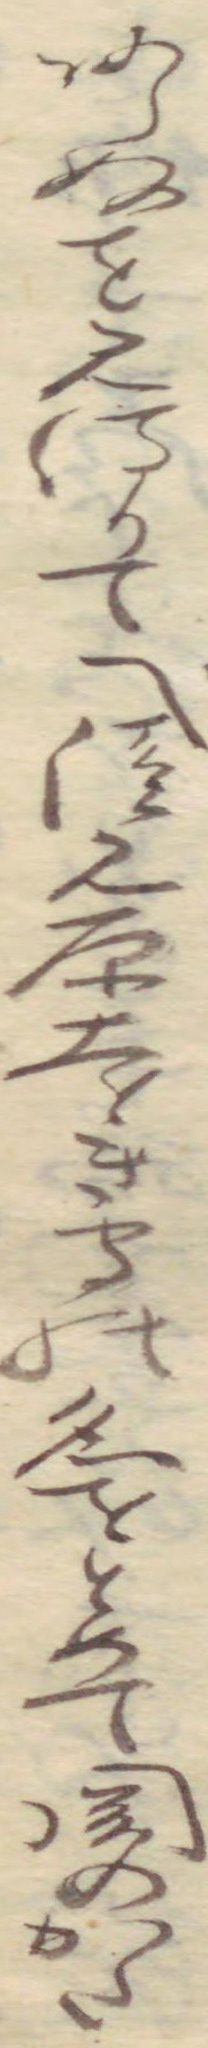あらぬを見侍りて〽清見原遠き守の名をとめて関のかた
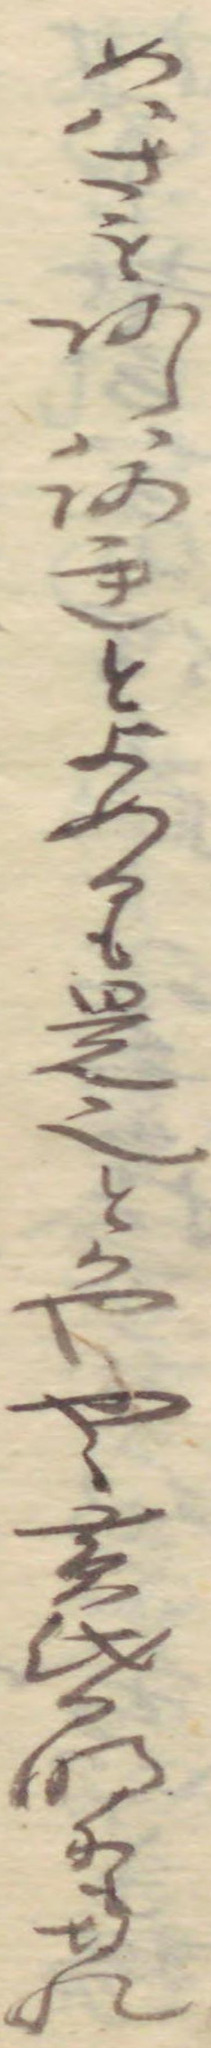めはさもあらはあれとよめるも是也とかややゝ黄昏時にもなれ
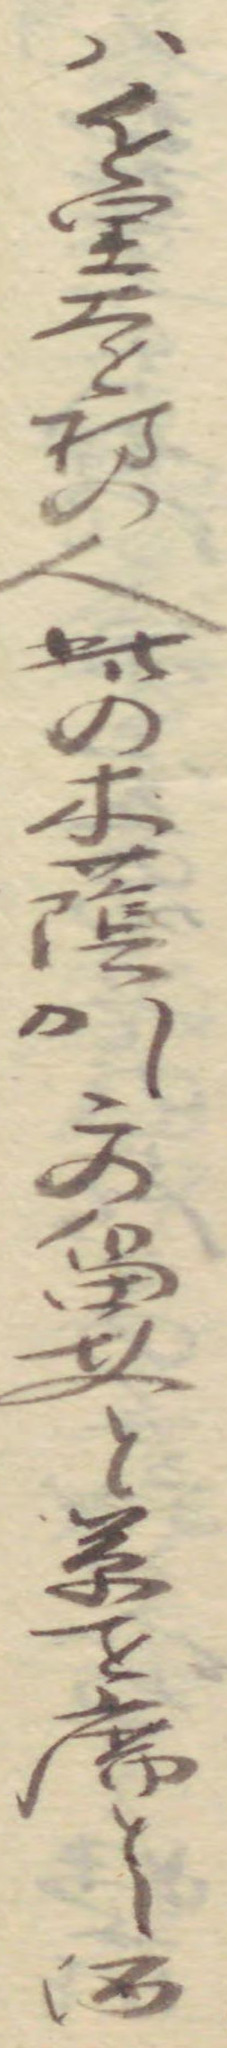は近里遠村の人此の木陰かしこの畠なと草を席とし酒
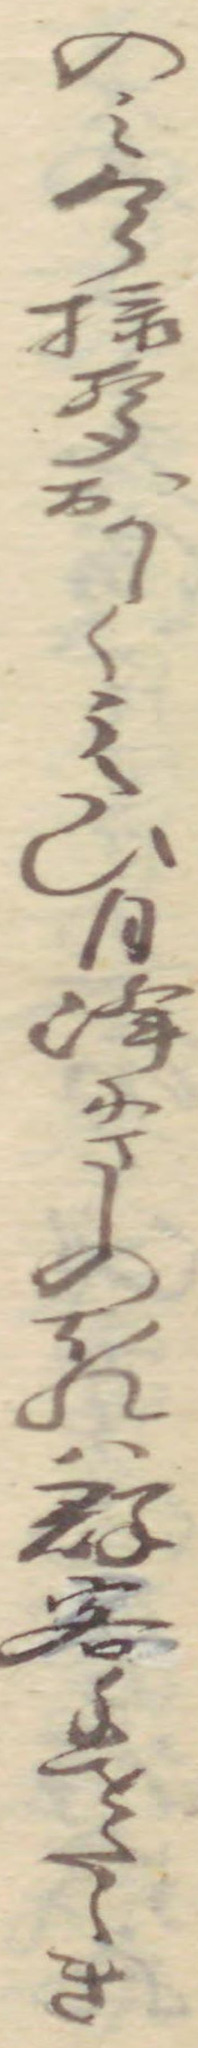のみ今様聲おかしくうたひ月峰にさしのほれは群客手をたゝき
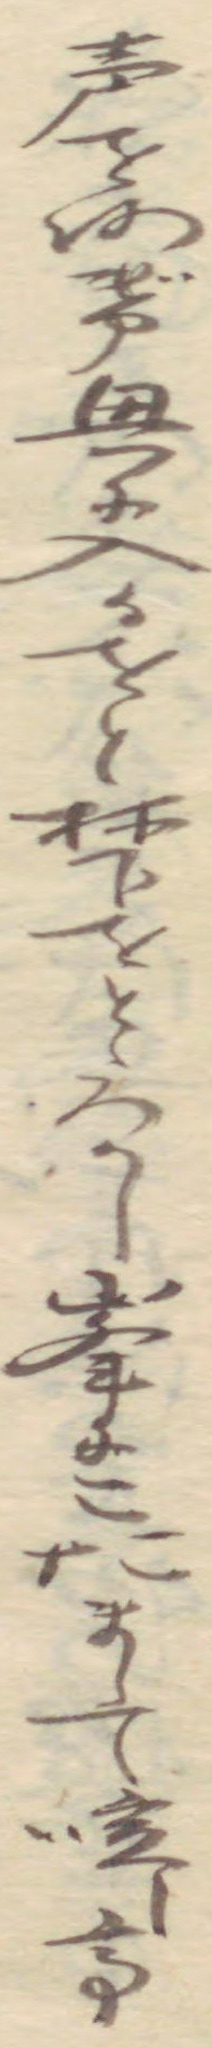声をあげ興に入るをと梺をとゝろかし峰にこたまして喧し亭
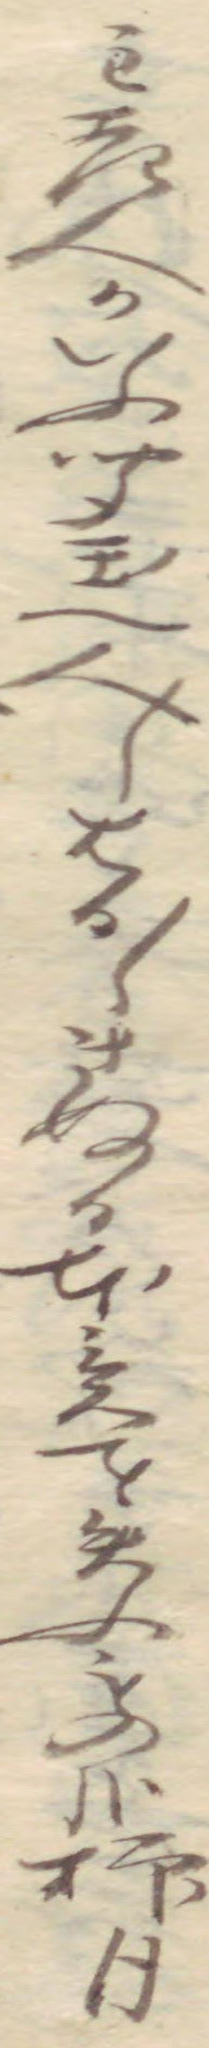主老人かいふ聞玉へ人〳〵はる〳〵きぬる本意を失ふもの哉抑月
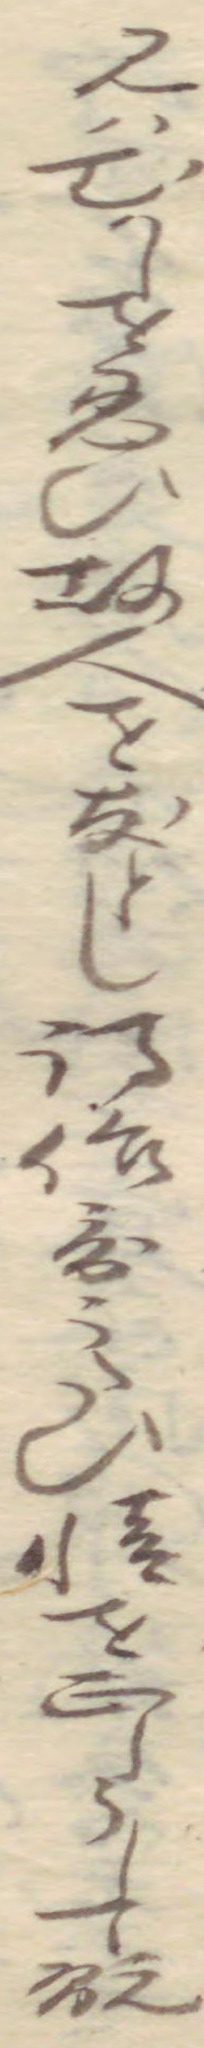見はむかしを忍ひ故人を友とし詩作歌うたひ情を正しうして翫
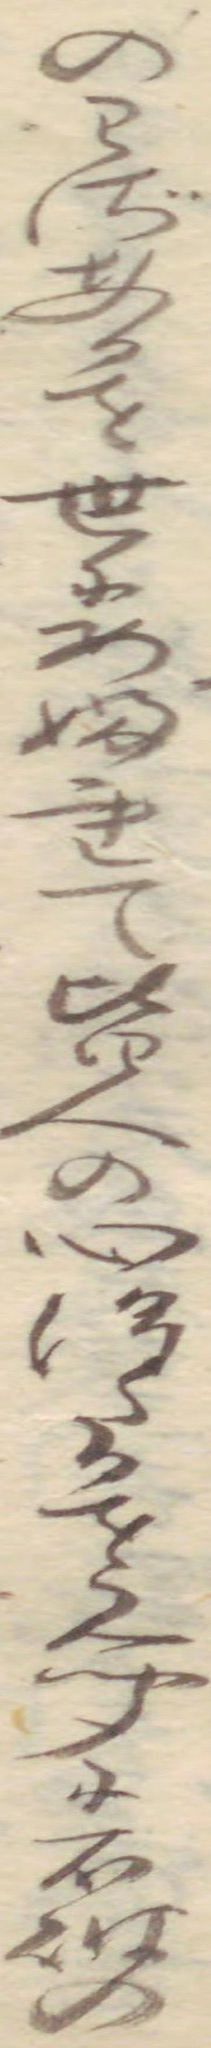のわざなるを世にあふれて皆人の心得たるを見聞に不破の
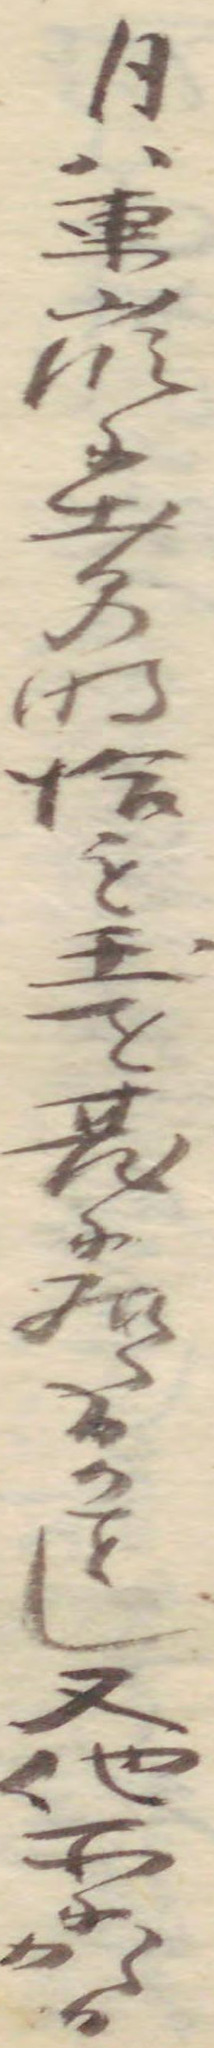月は東嶺に出るの時恰も玉を台に居たるかことし又他所にかゝる
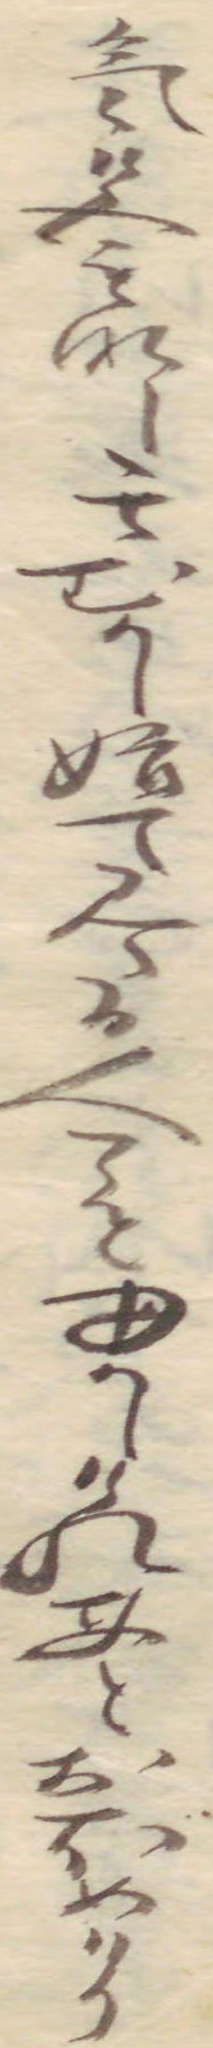気色もなし其むかし始て見たる人こそゆかしけれなとおほめけり
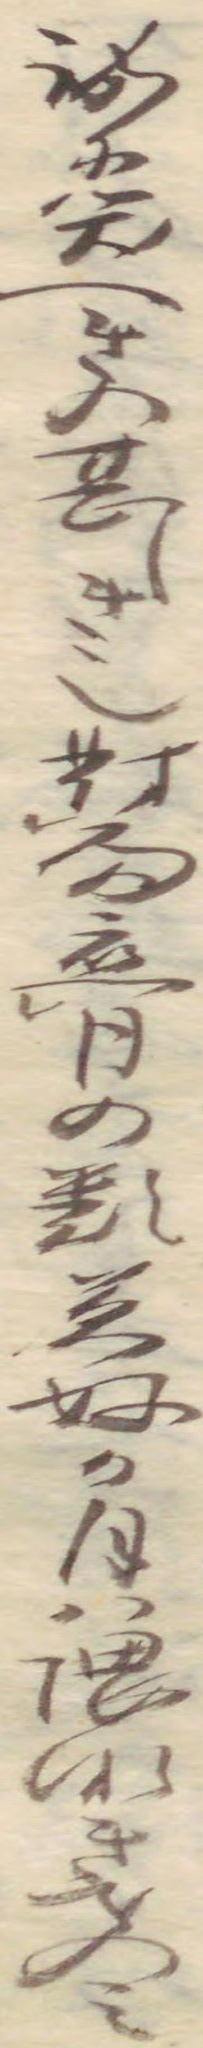誠に笑へきの甚しき也対雨応月の類兼好か月は隈なきをのみ
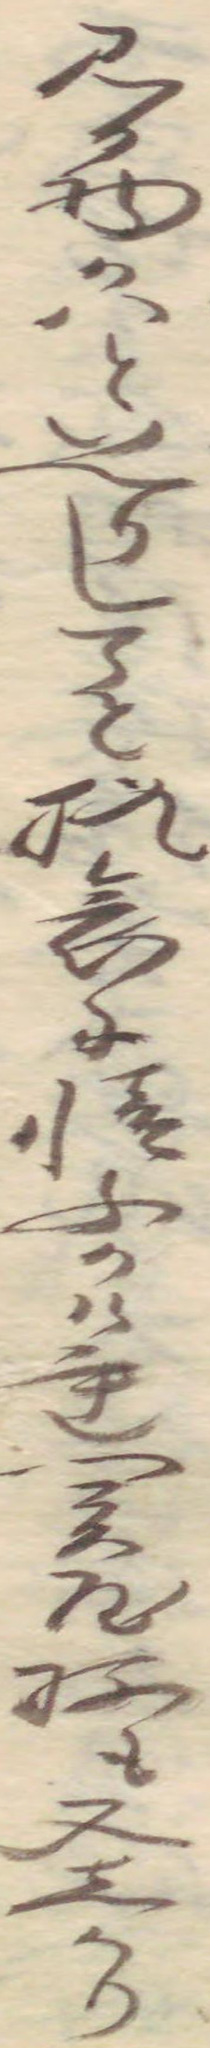見る物かはといへりしこそ猶哀に情ふかけれ関屋抔も又しかり
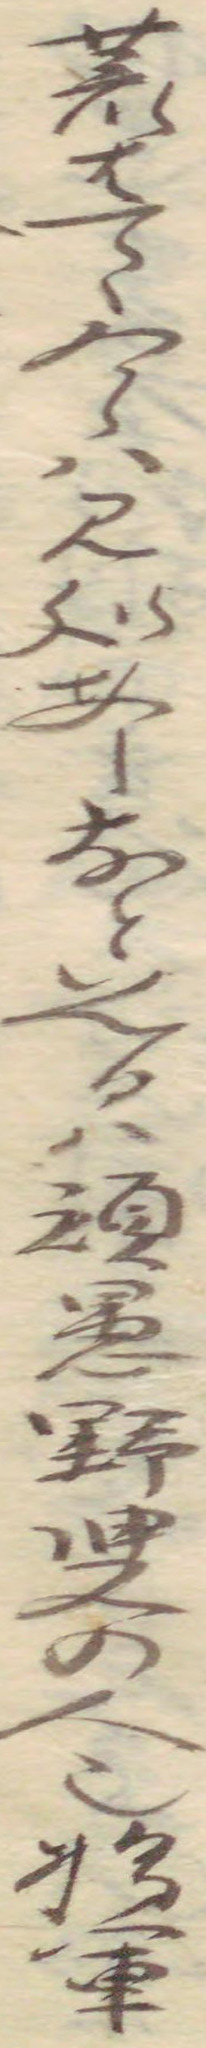荒はてゝ今は見処なしなといへるは頑愚野叟の人也将軍
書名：鶯宿雑記. 巻263-264
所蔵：国立国会図書館 National Diet Library, JAPAN
